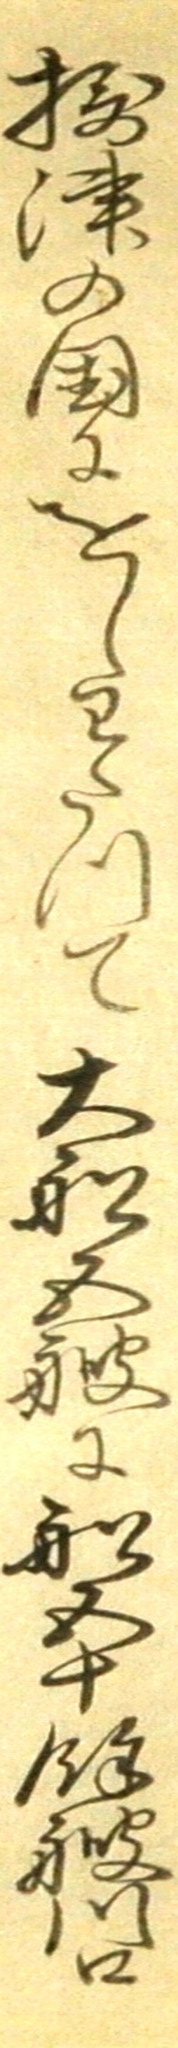摂津の国にをしわたつて大船五艘に船五十余艘川口
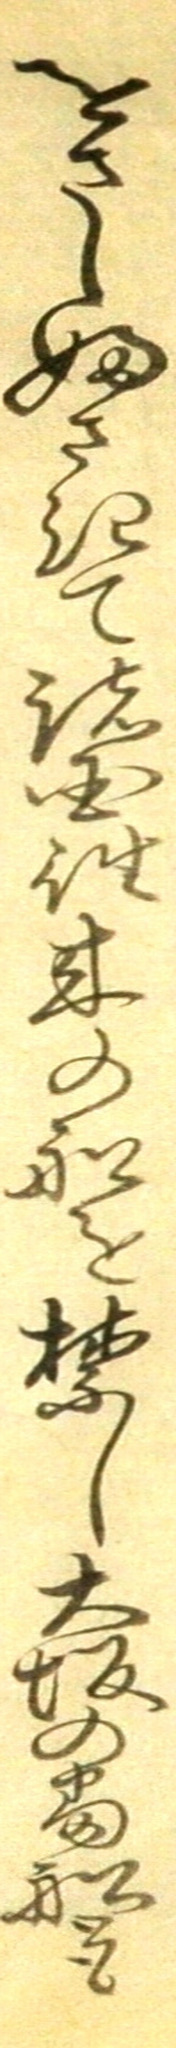をさしふさきて諸国往来の船を禁し大坂の番船とも
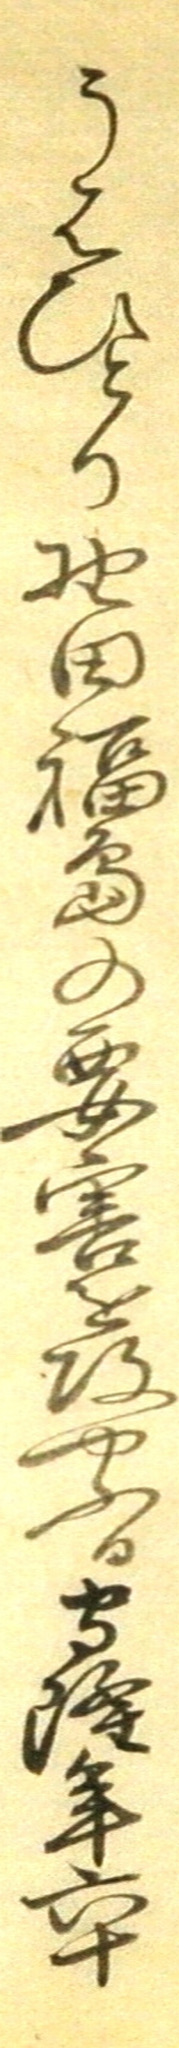うはひとり野田福島の要害を攻やふる守隆年六十
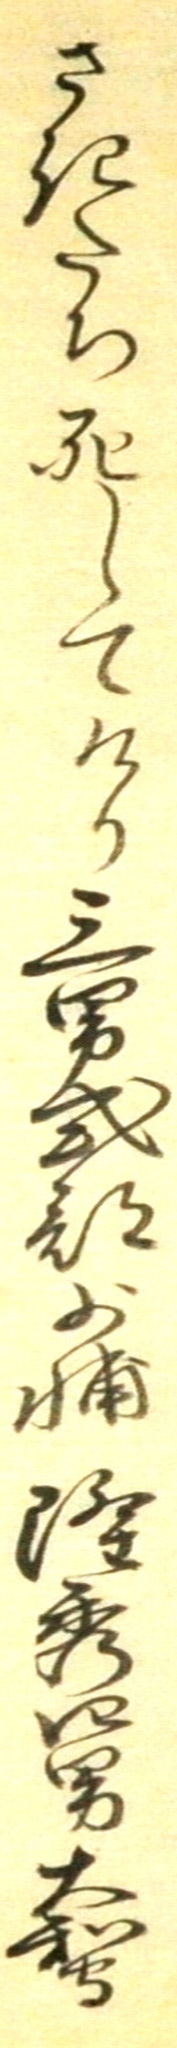さきたち死してけり三男式部少輔隆秀四男大和守
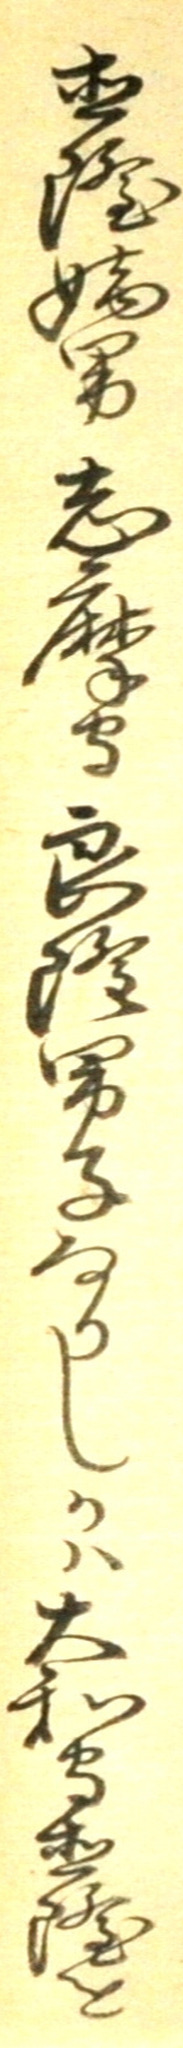直隆嫡男志摩守良隆男子なりしかは大和守直隆を
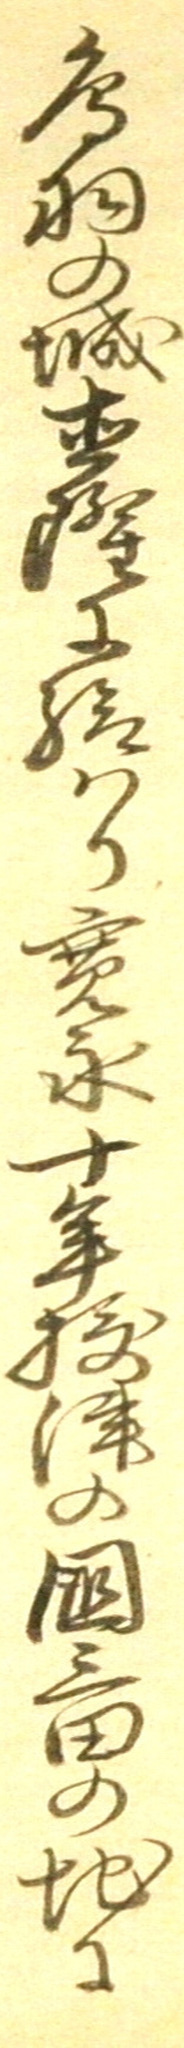鳥羽の城直隆に給はり寛永十年摂津の国三田の地に
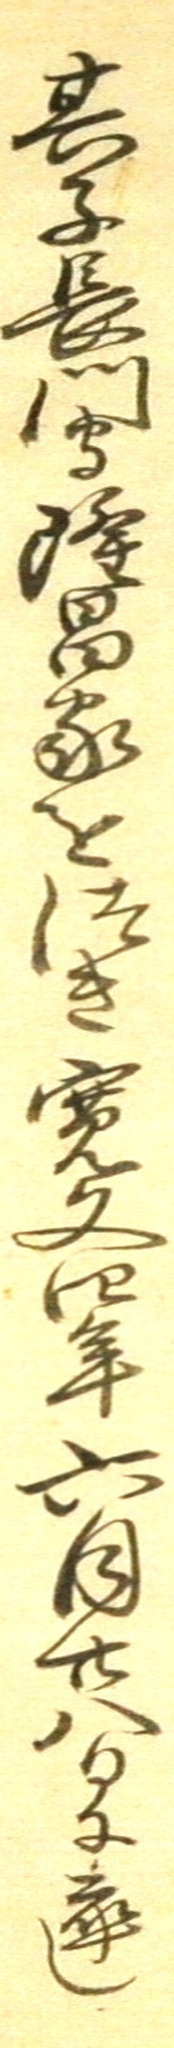其子長門守隆昌家をつき寛文四年六月廿八日に卒し
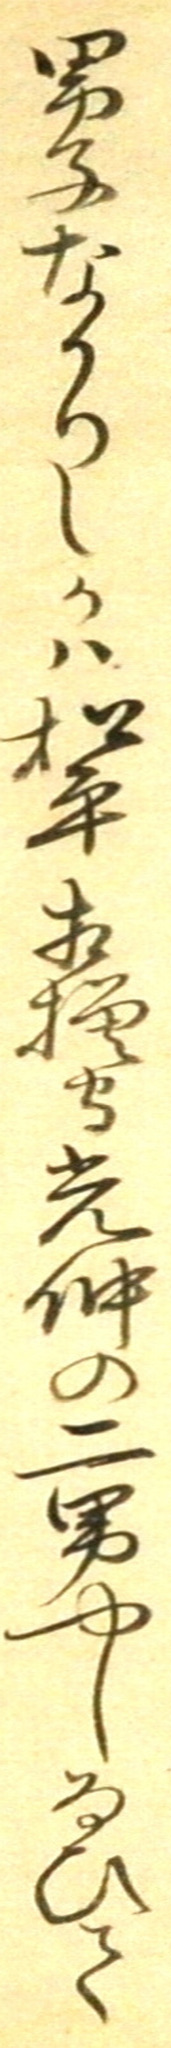男子なかりしかは松平相模守光仲の二男やしなひて
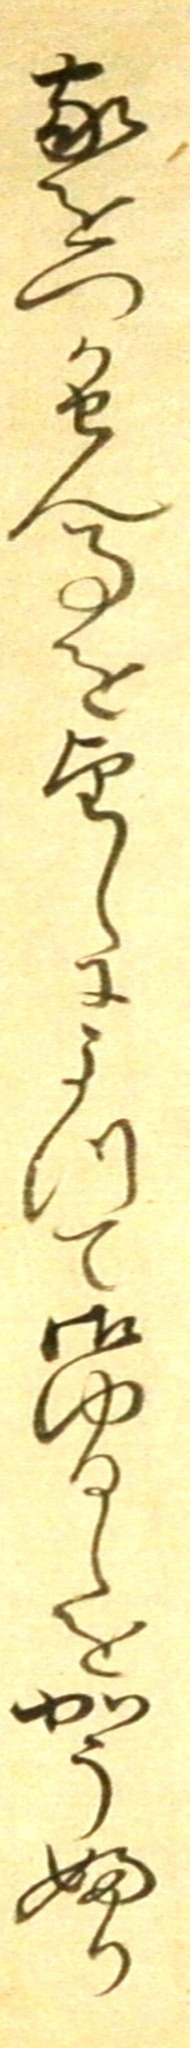家をつかせん事を望しによつて御ゆるしをかうふり
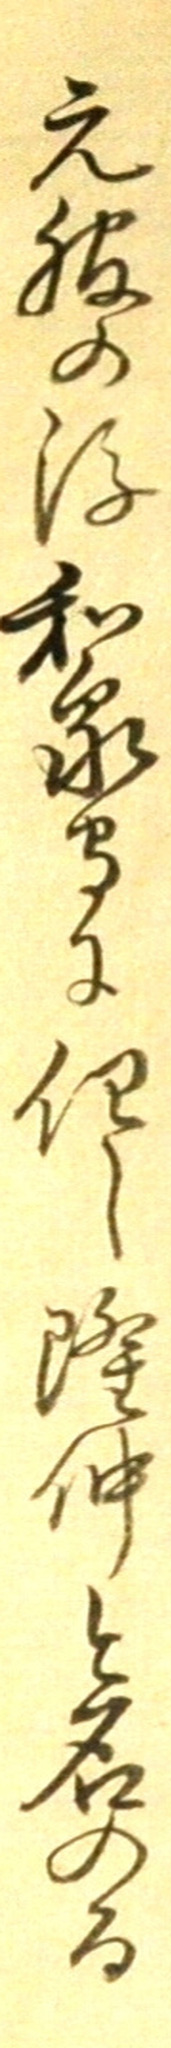元服の後和泉守に任し隆仲と名のる
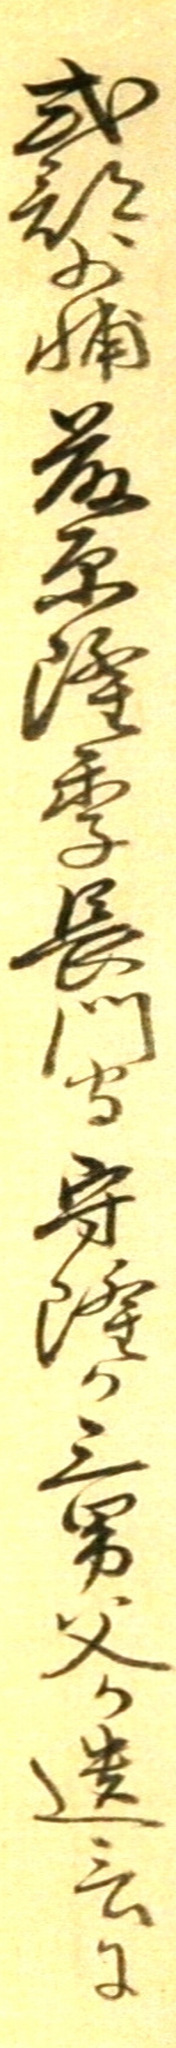式部少輔藤原隆季長門守守隆か三男父か遺言に

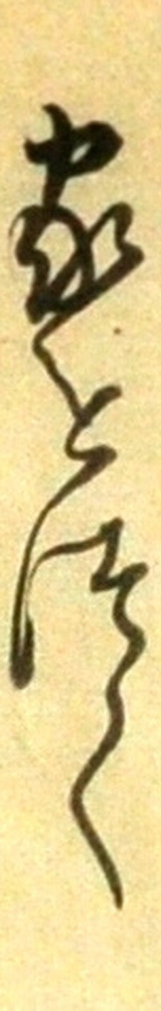家をつく
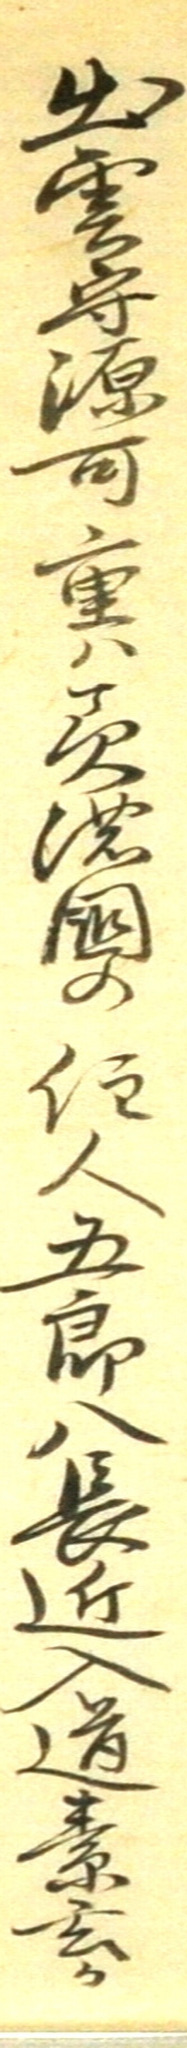出雲守源可重は美濃国の住人五郎八長近入道素玄か
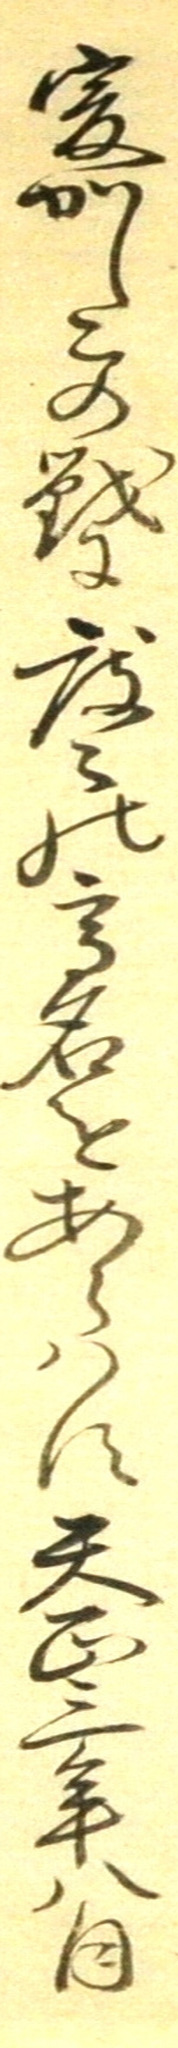爰かしこの戦に度々の高名をあらはす天正三年八月
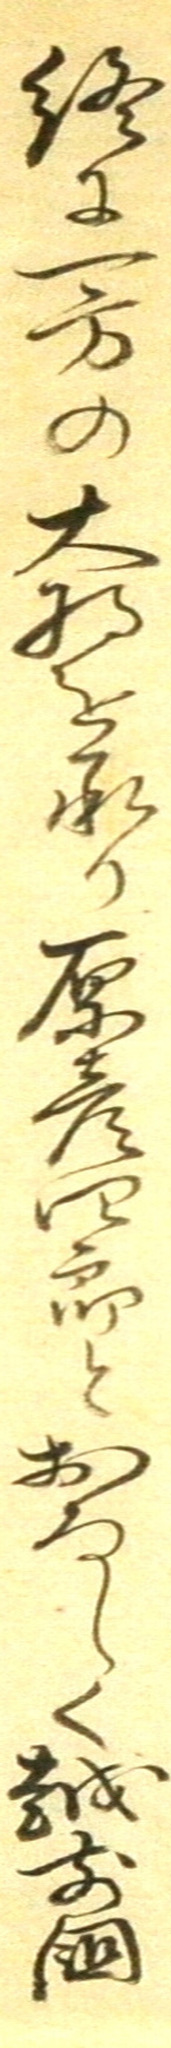終に一方の大将を承り原彦四郎とおなしく越前国
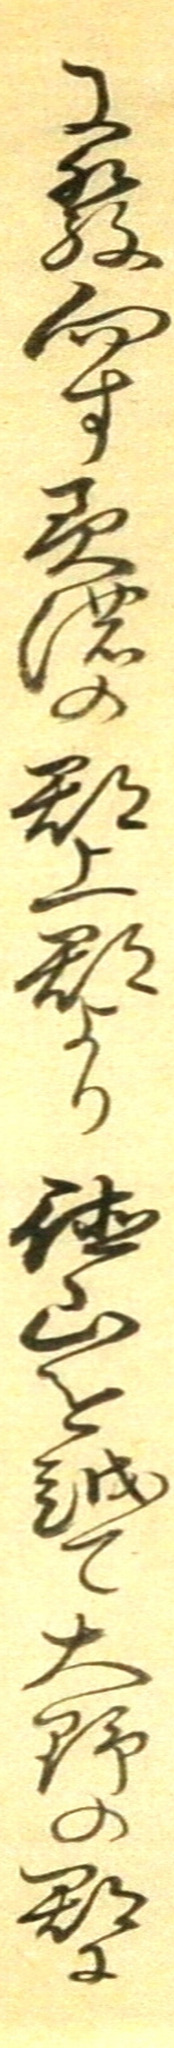に発向す美濃の郡上郡より徳山を越て大野の郡に
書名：藩翰譜（九・上）
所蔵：伊那市立高遠町図書館・合同会社AMANE
